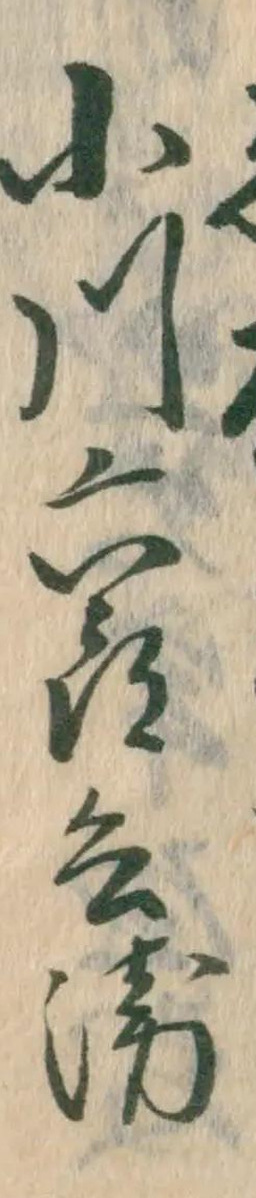小川六郎兵衛
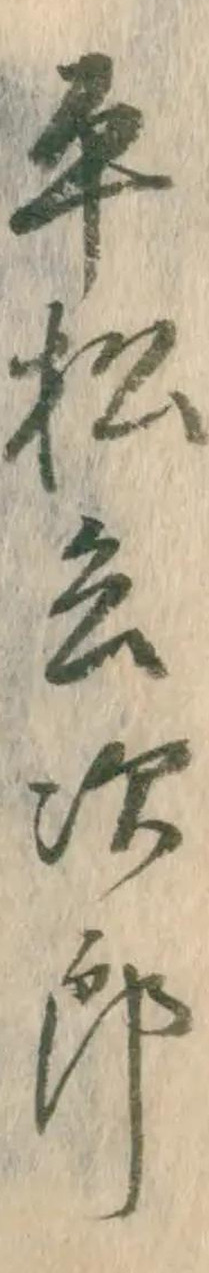平松兵次郎
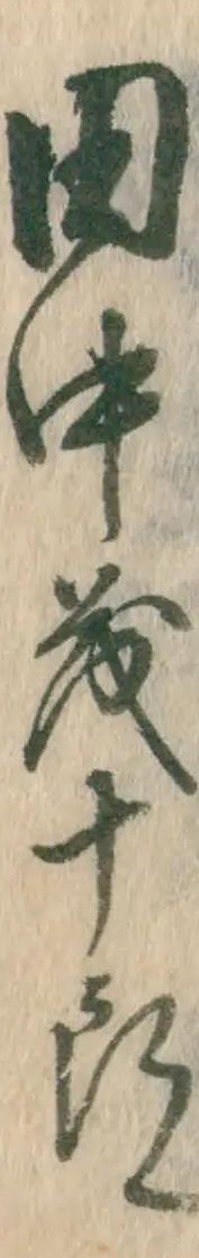田中茂十郎

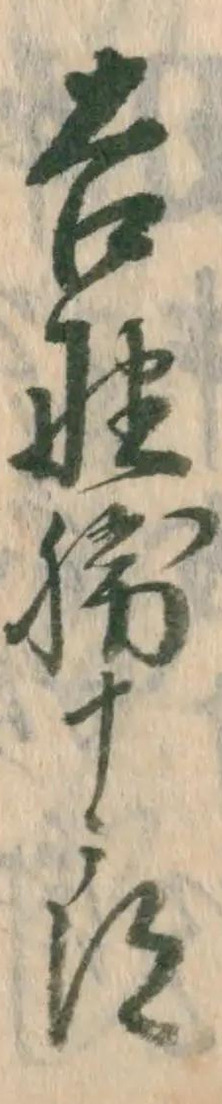吉野勝十郎
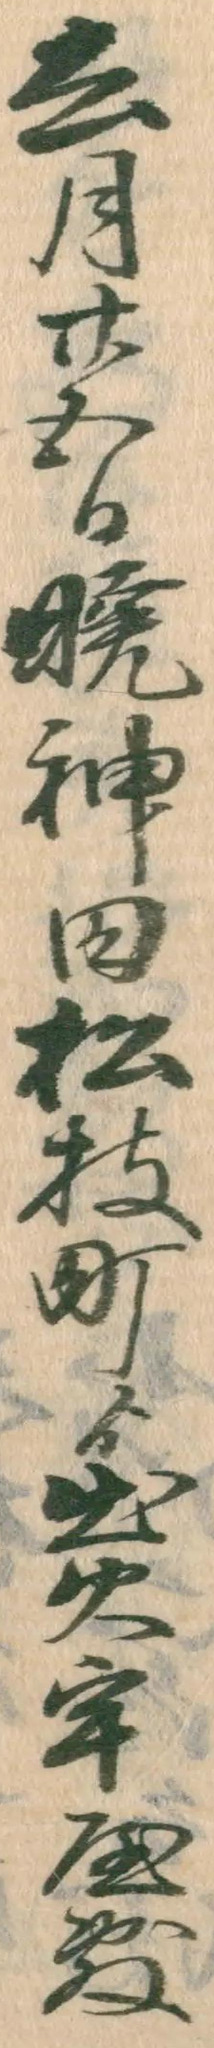去月廿五日暁神田松枝町ゟ出火牢屋敷
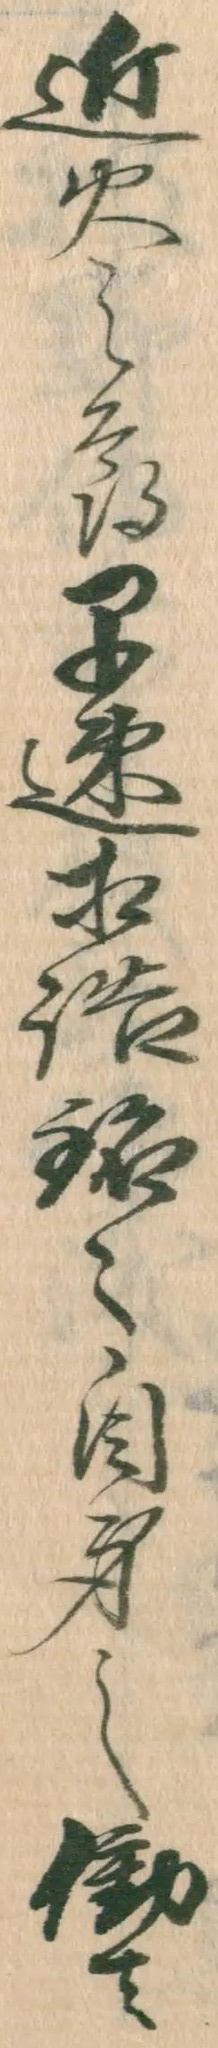近火之節早速相詰銘〻自身之働は
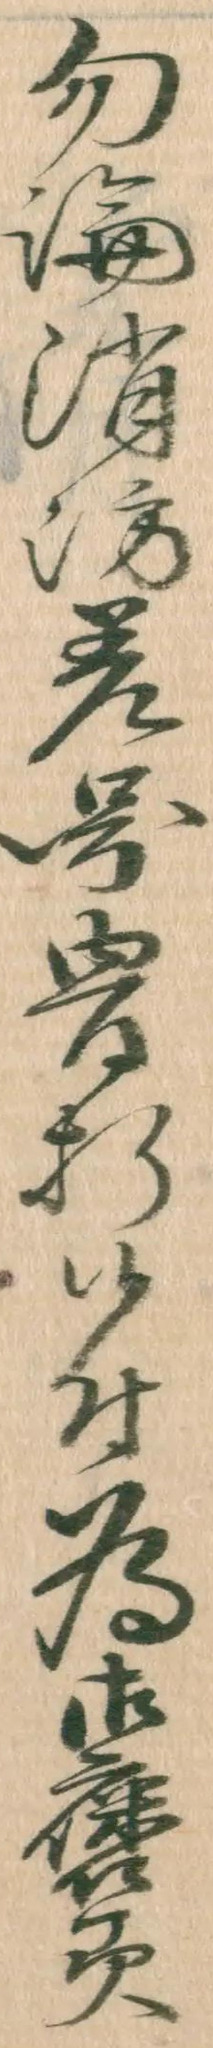勿論消防指図骨折候付為御褒美
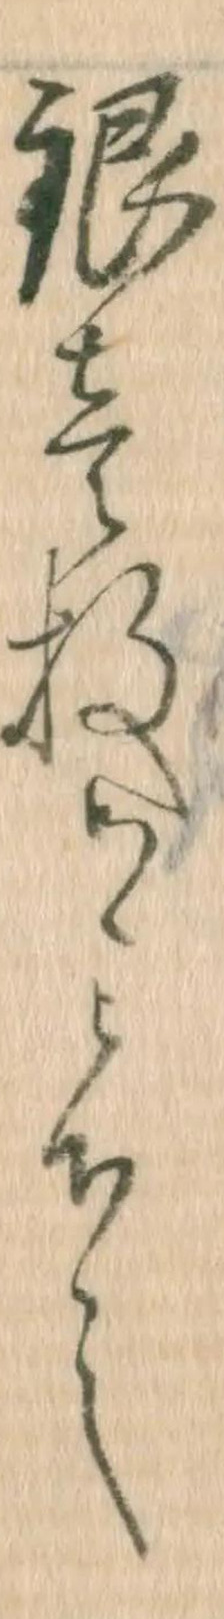銀壱枚ツヽ被下之
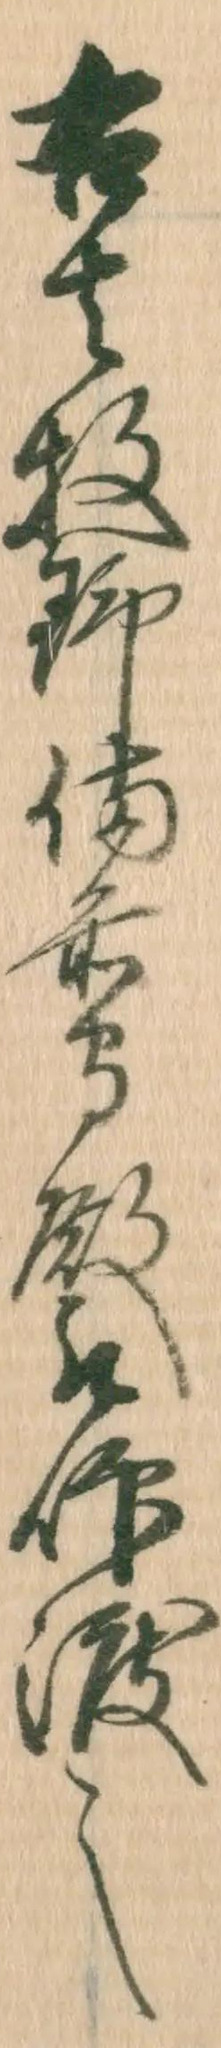右は牧野備前守殿被仰渡之
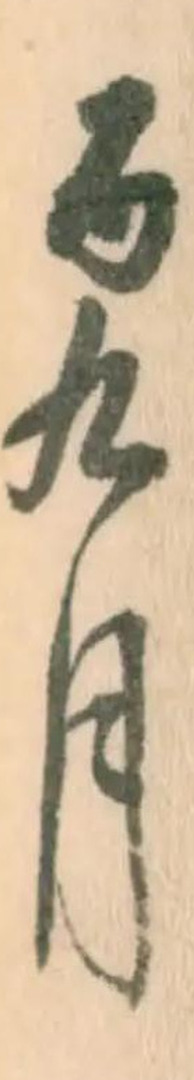酉九月
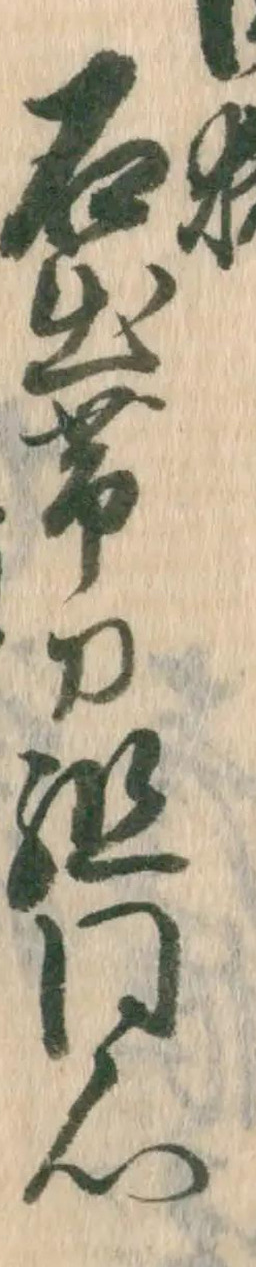石出帯刀組同心
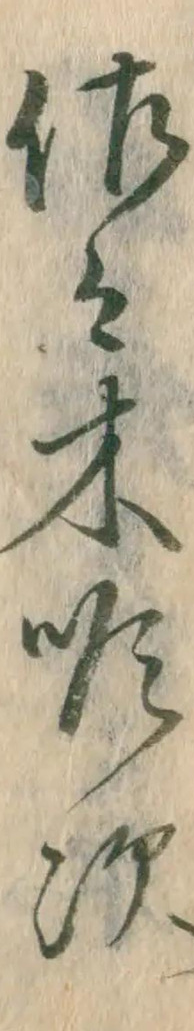佐々木順次

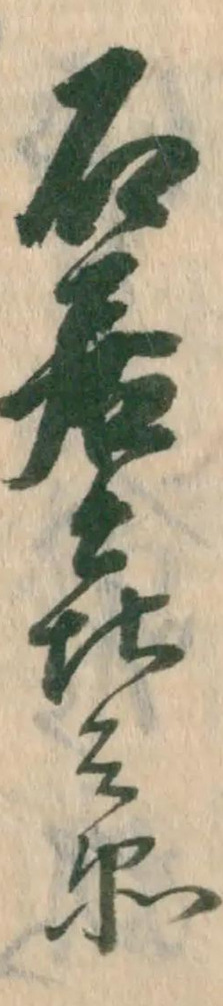石居喜兵衛
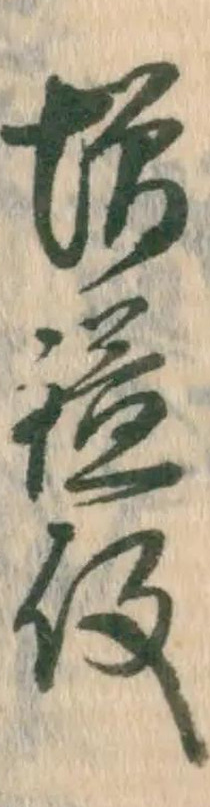増鎰役
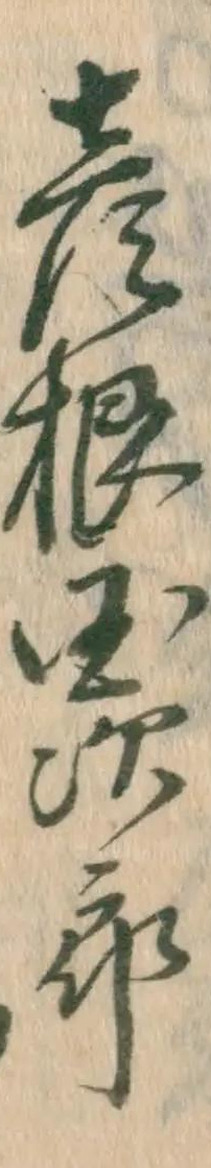彦根国次郎
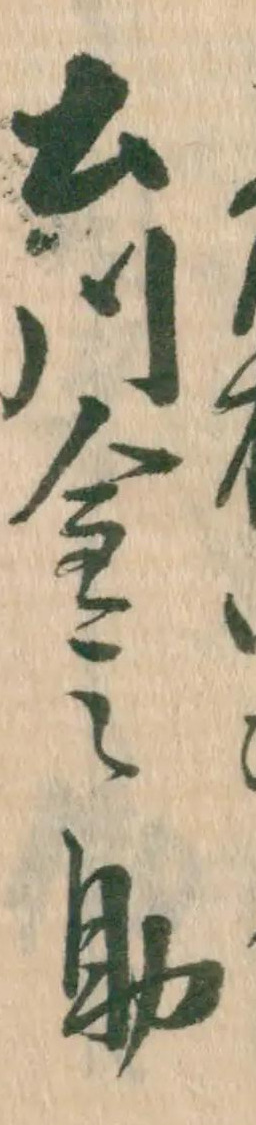大川金之助
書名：七十冊物類集 71巻. [44] 四十三 牢屋敷御普請御修覆地震ニ付骨折候牢屋掛御褒美之部
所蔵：国立国会図書館 National Diet Library, JAPAN
